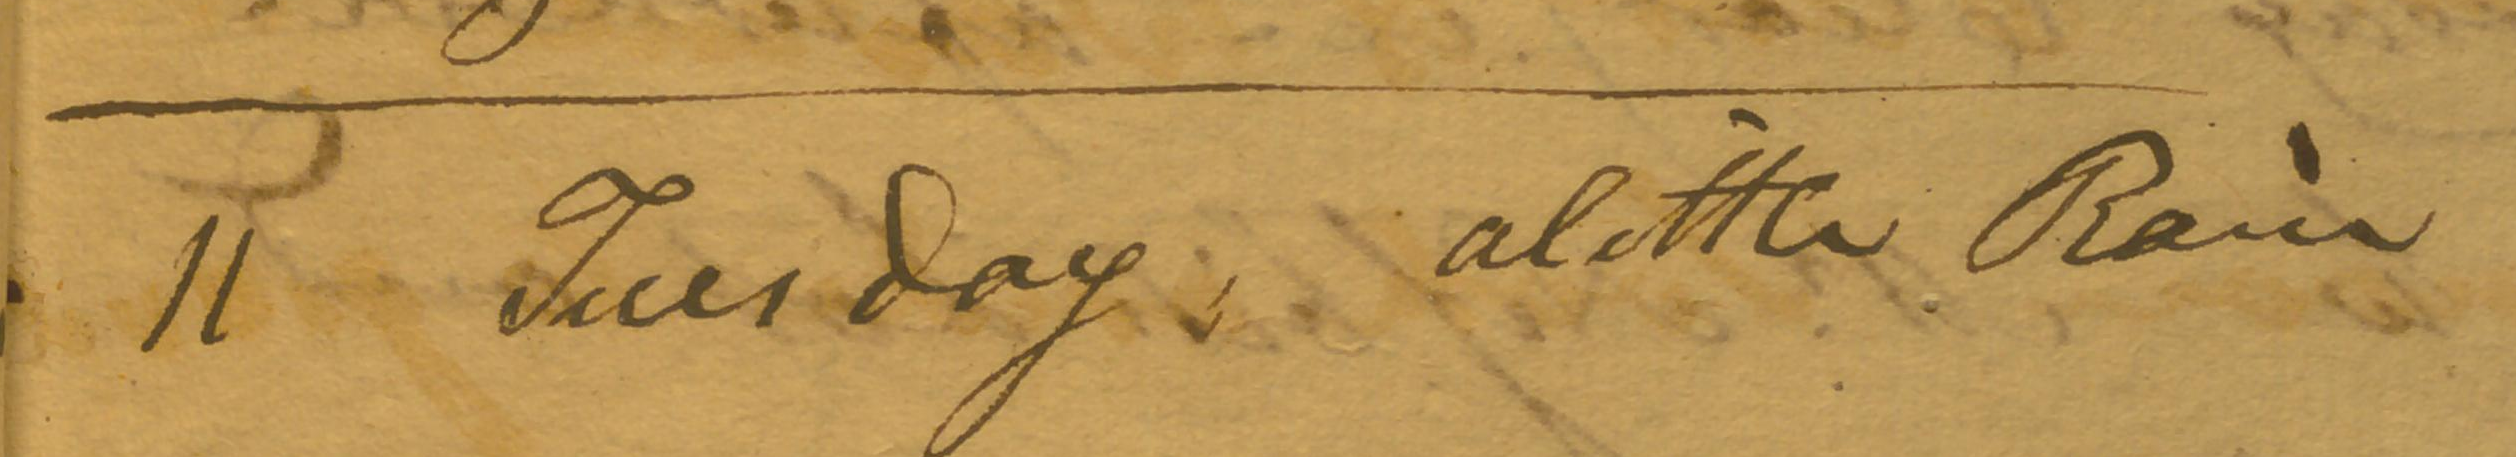11 Tuesday, a little Rain
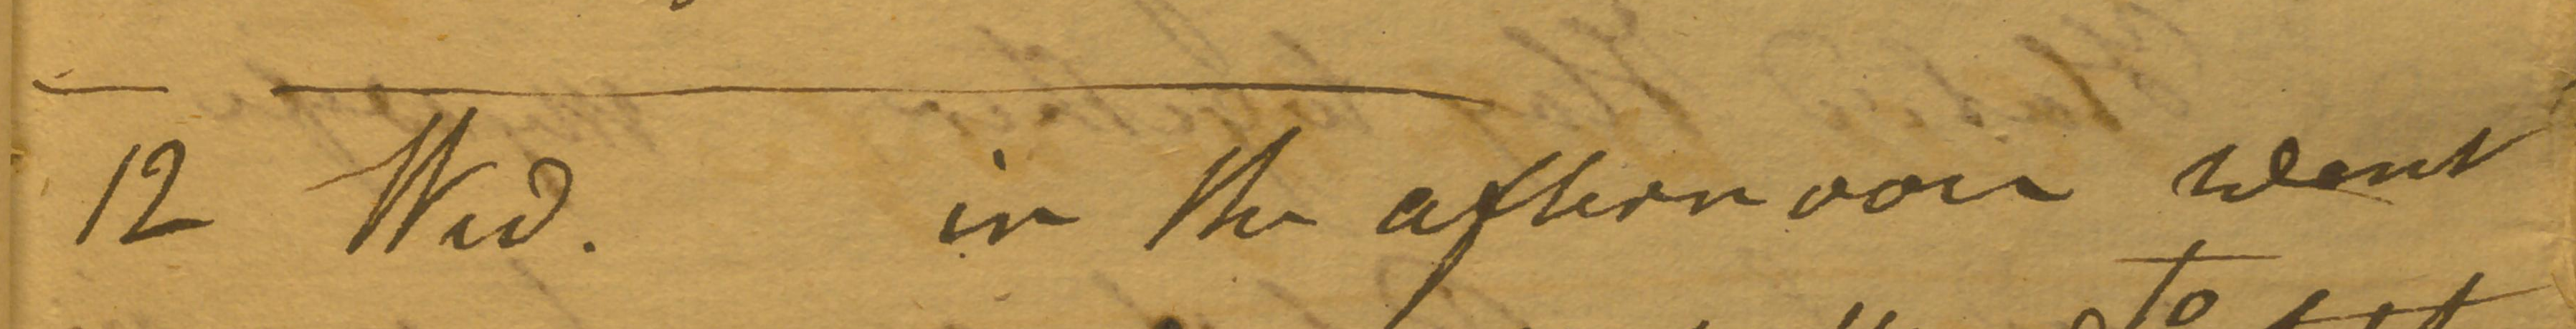12 Wed. in the afternoon went
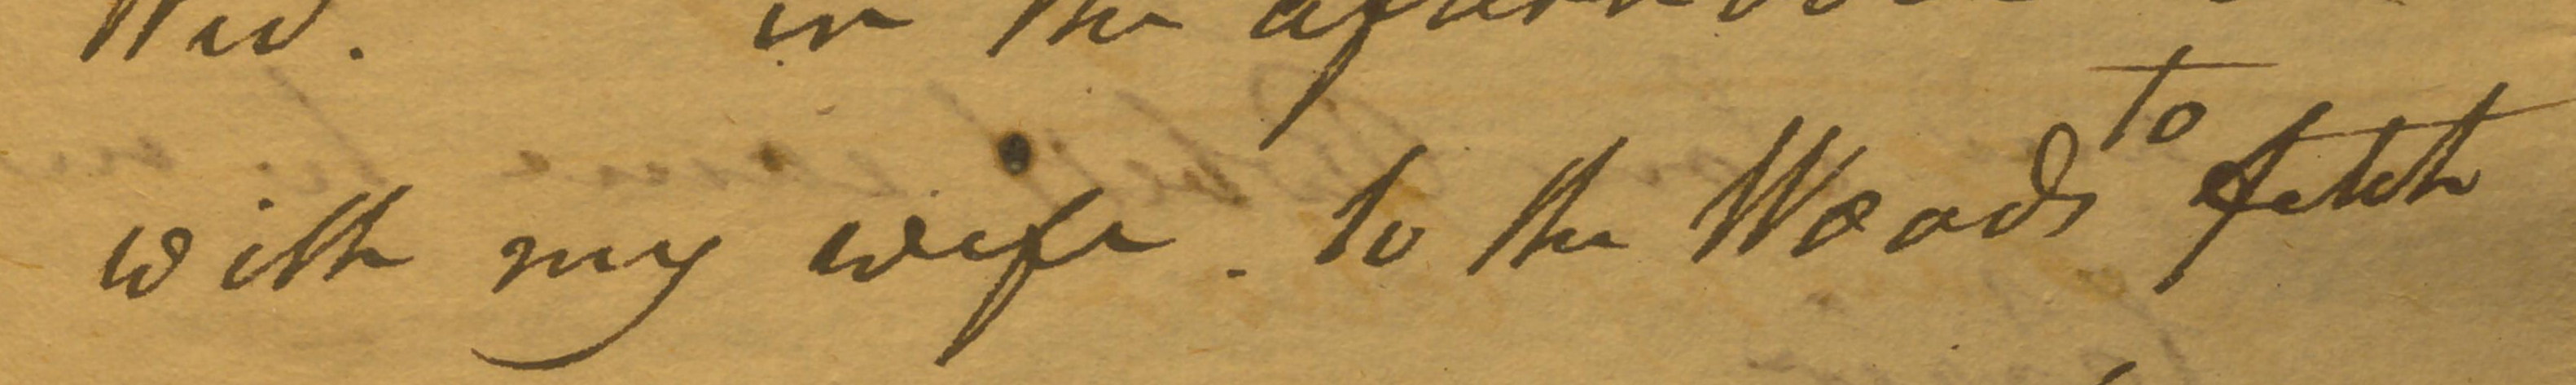with my wife to the Woods ^to fetch
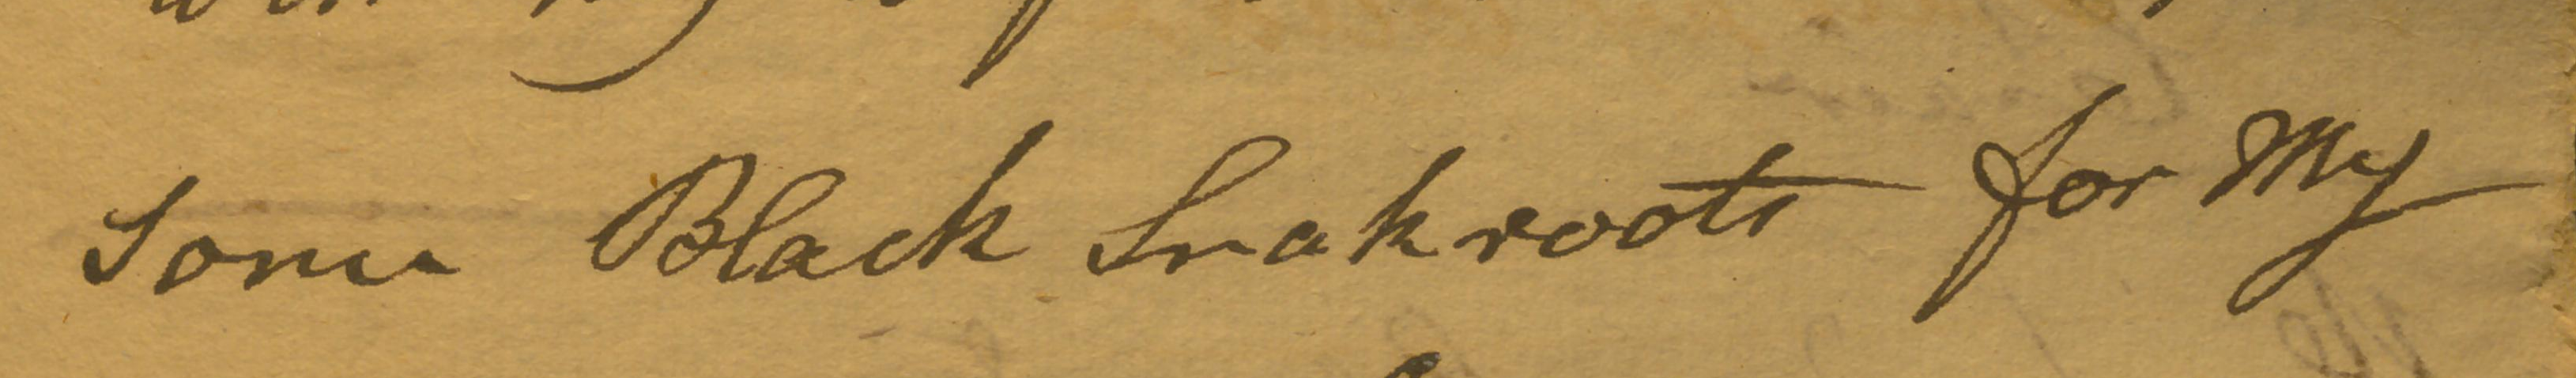some Black Srakroots for My
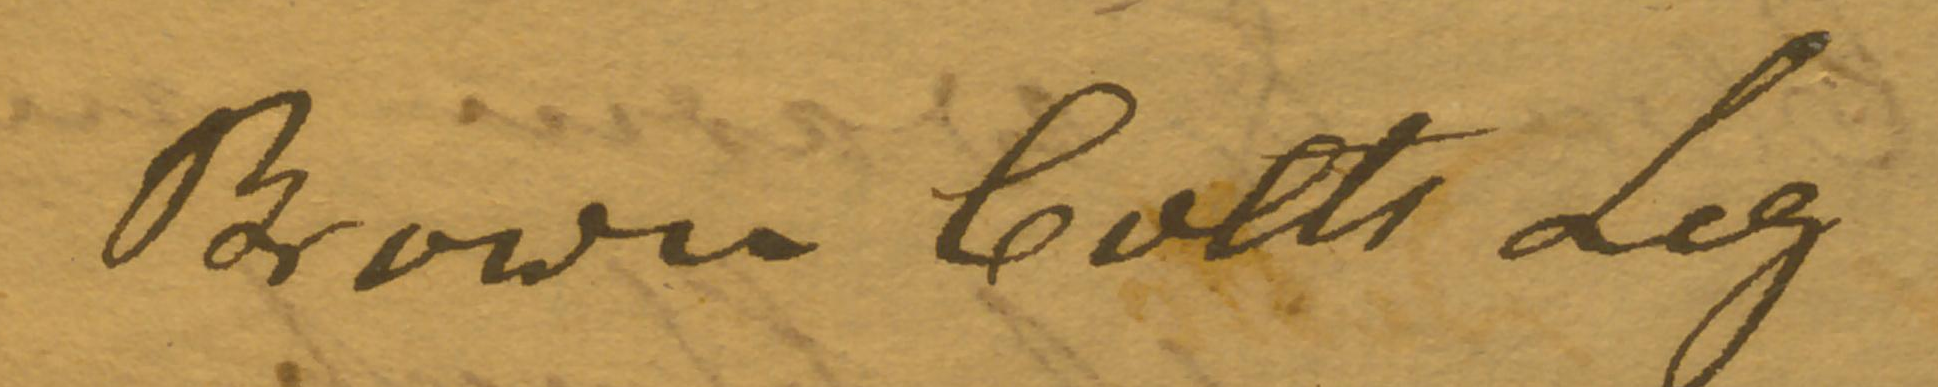Brown Colts Leg
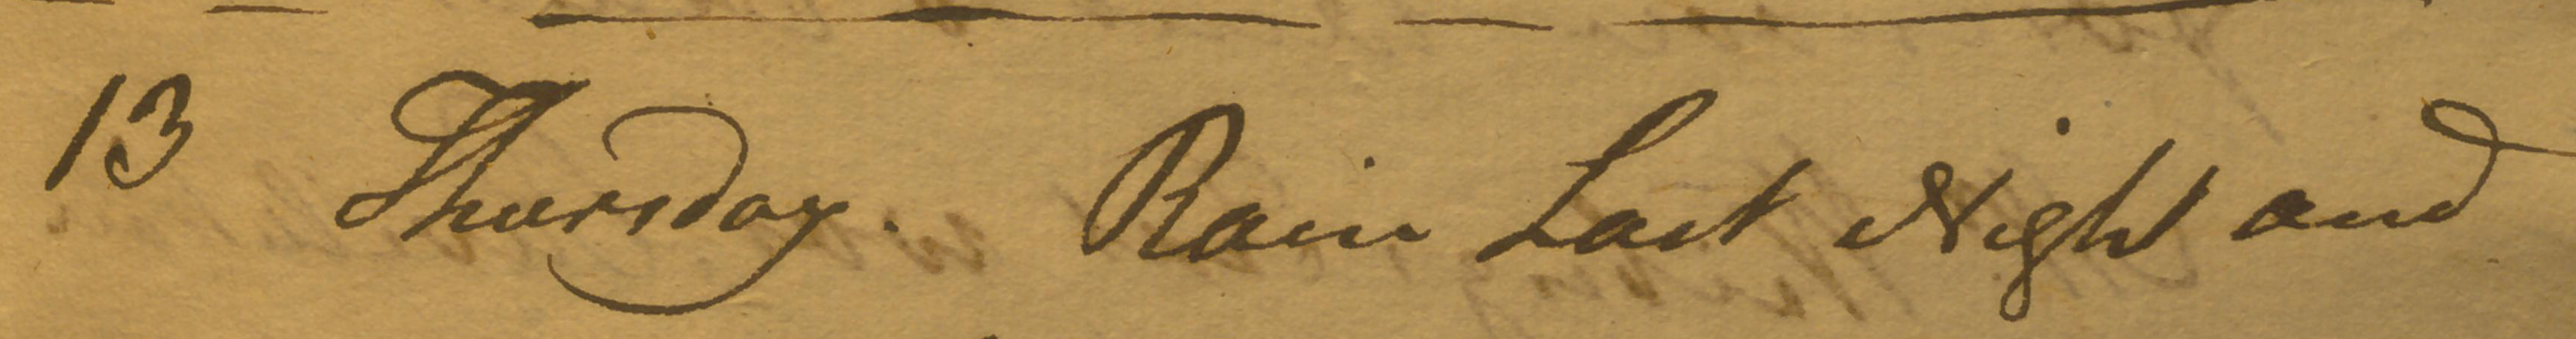13 Thursday. Rain Last Night and
